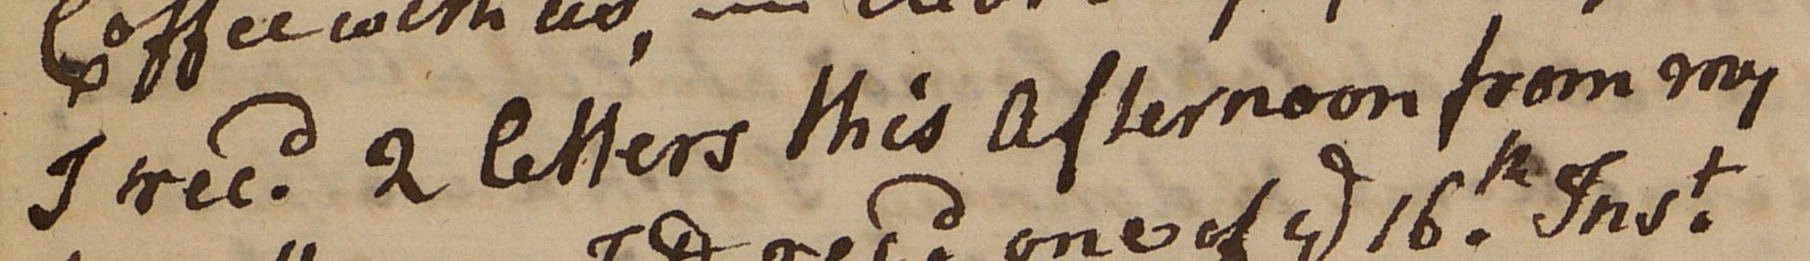I rec^d. 2 letters this Afternoon from my
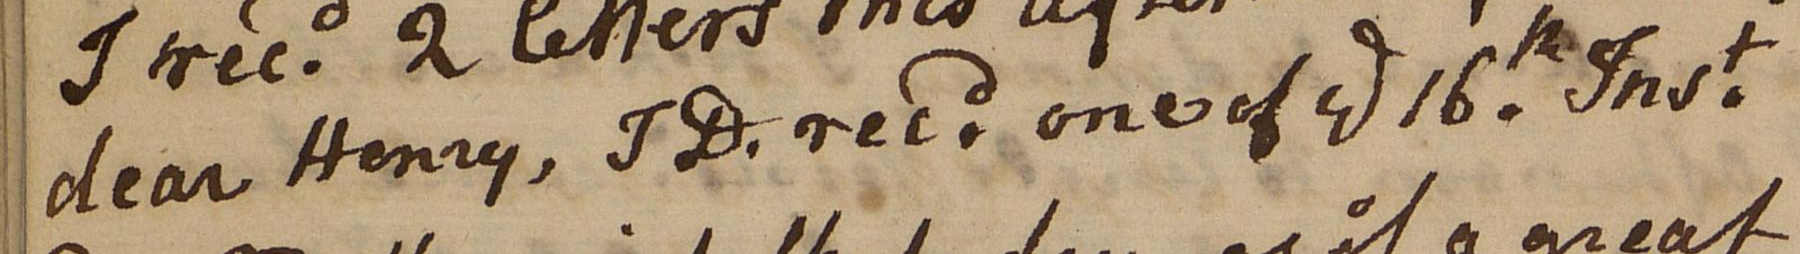dear Henry, ID. rec^d one of y^e 16^th. Ins^t.
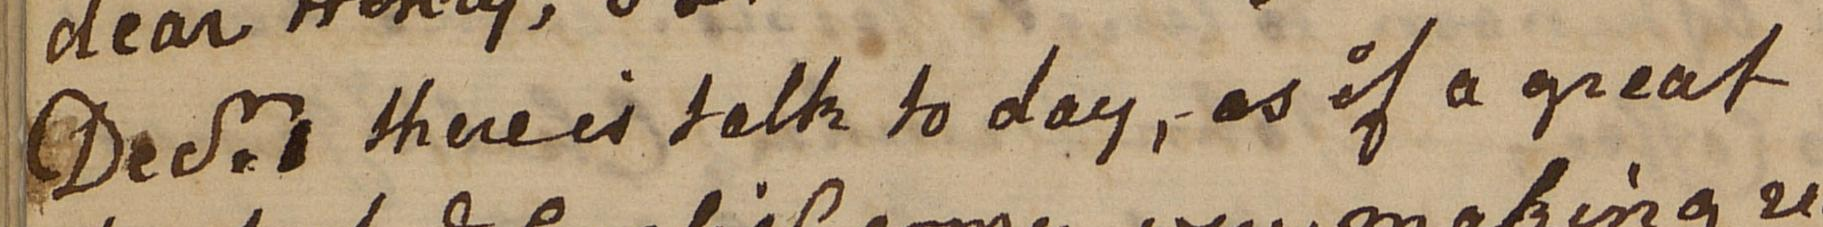Dec^r. there is talk to day, as if a great
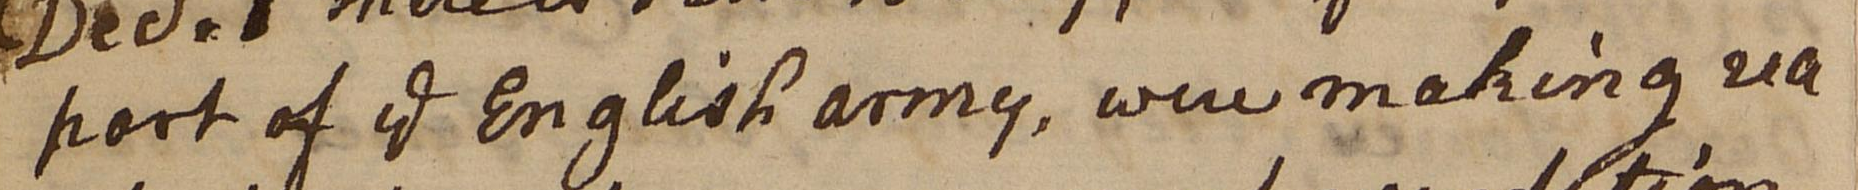part of y^e English army, were making rea
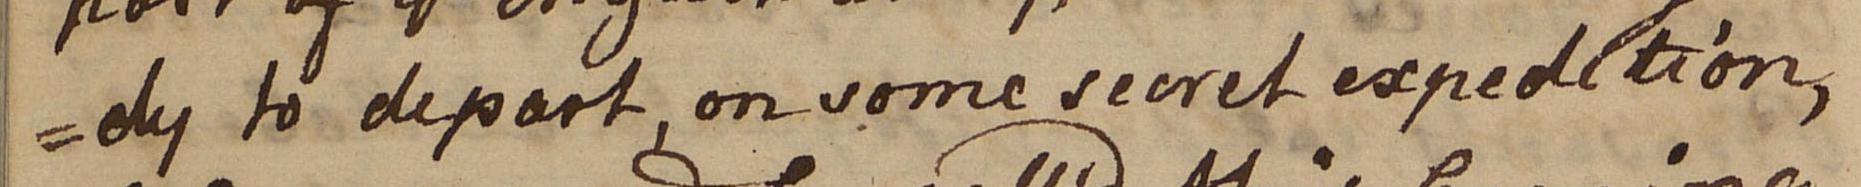-dy to depart, on some secret expedition,
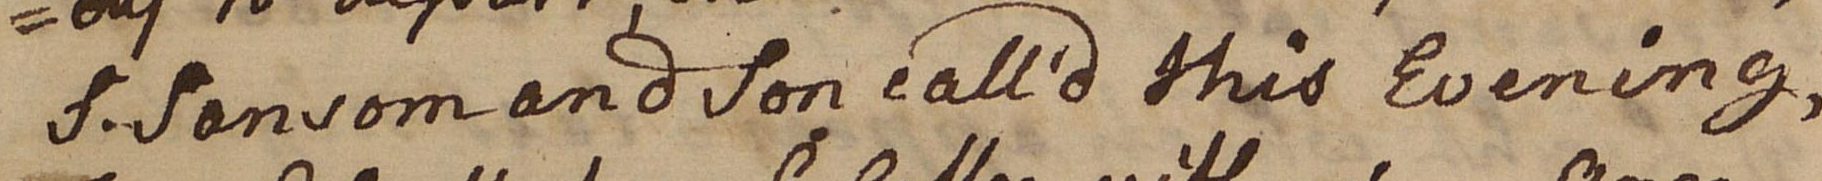S. Sansom and Son call'd this Evening,
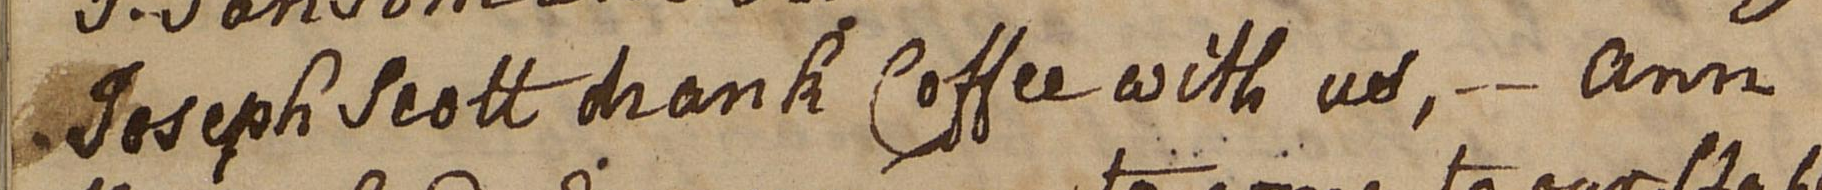Joseph Scott drank Coffee with us,-- Ann
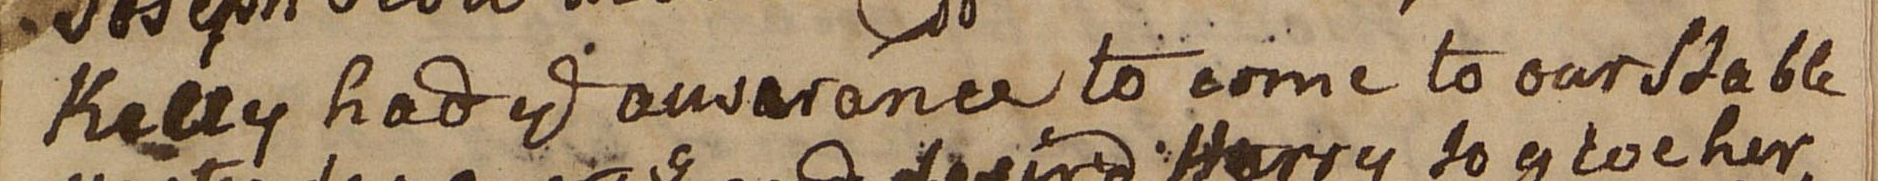Kelly had y^e ausarance to come to our Stable
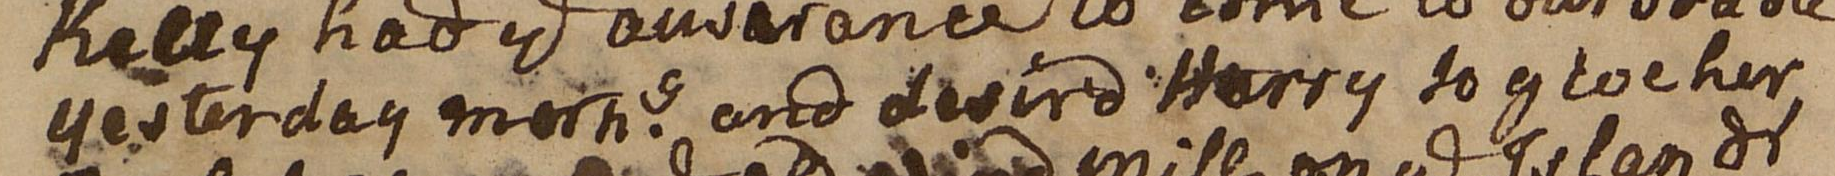yesterday morn^g. and desir'd Harry to give her,
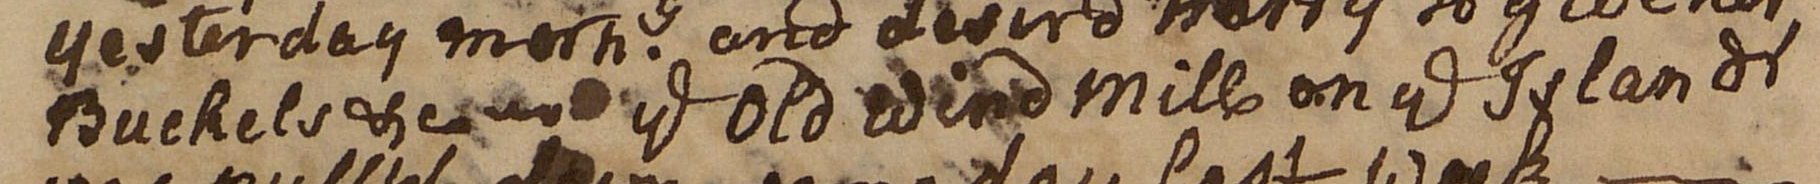Buckels &c - y^e Old Wind Mill on y^e Islands
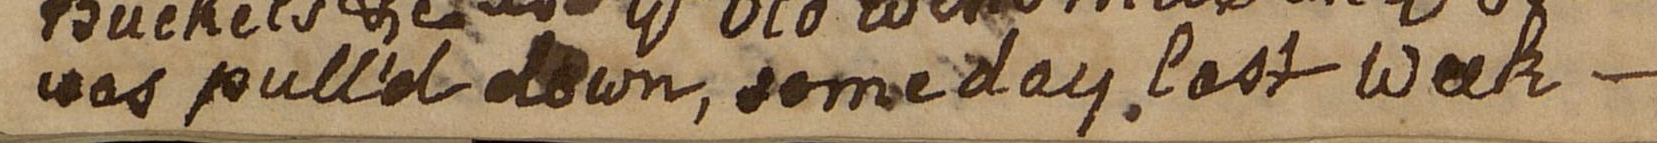was pull'd down, someday last week-
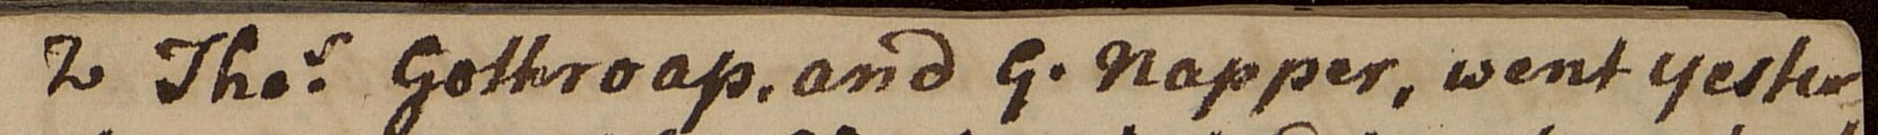2 Tho^s. Gothroap, and G. Napper, went yester
